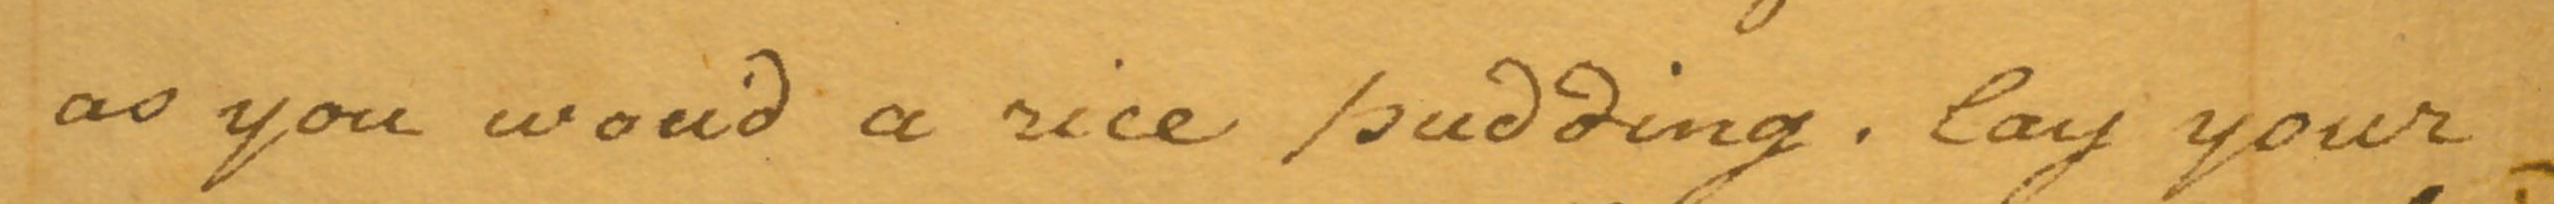as you wou'd a rice pudding. lay your
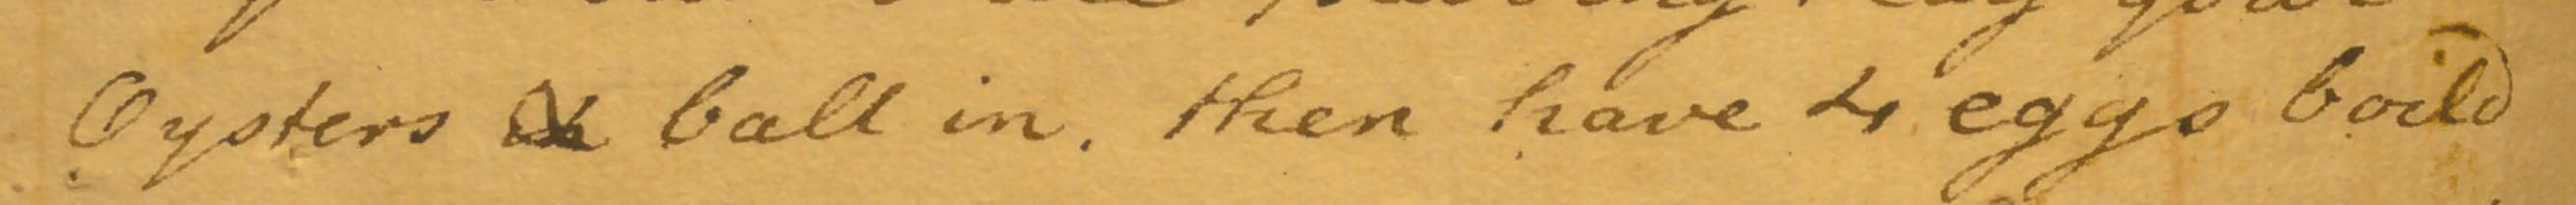Oysters & ball in. then have 4 eggs boild
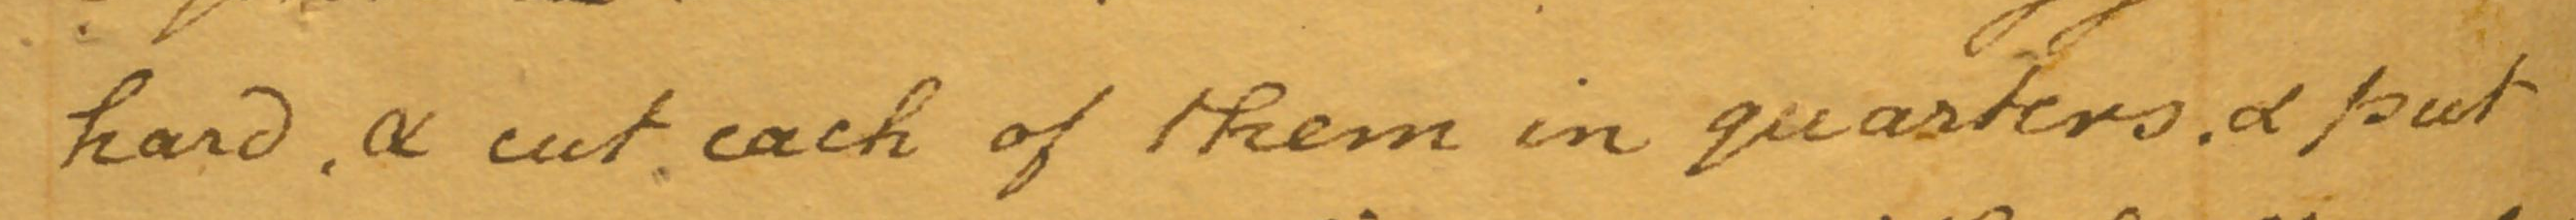hard, & cut each of them in quarters. & put
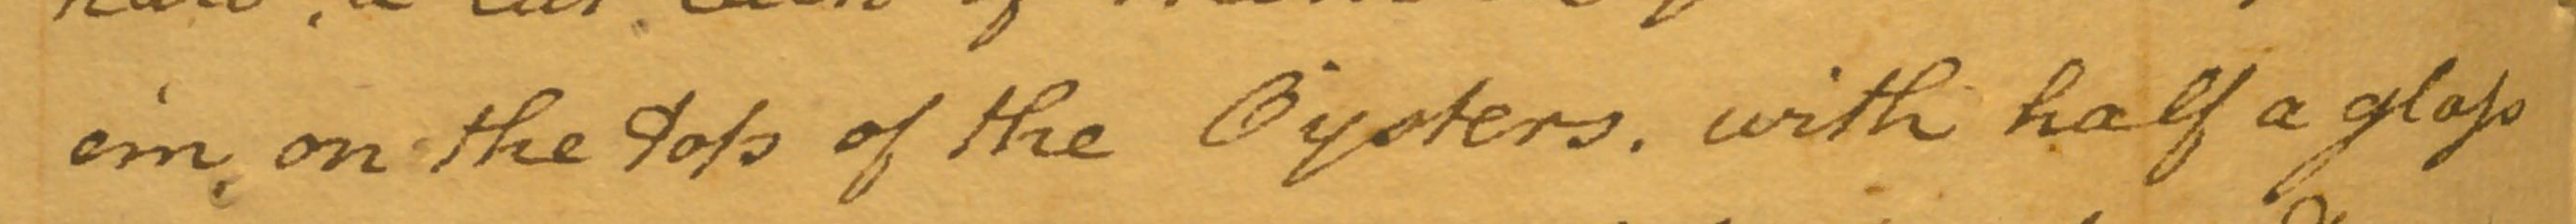'em on the top of the Oysters, with half a glass
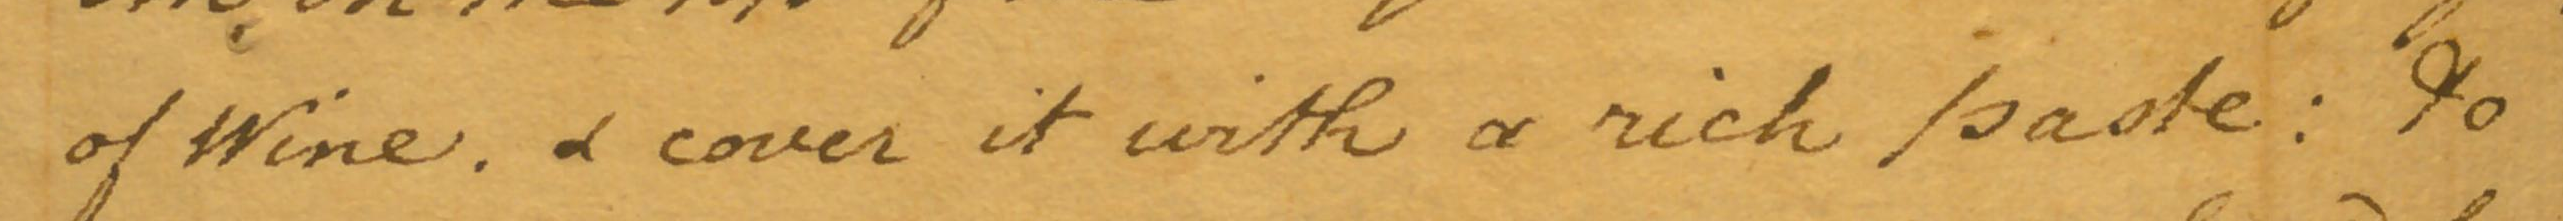of Wine. & cover it with a rich paste: to
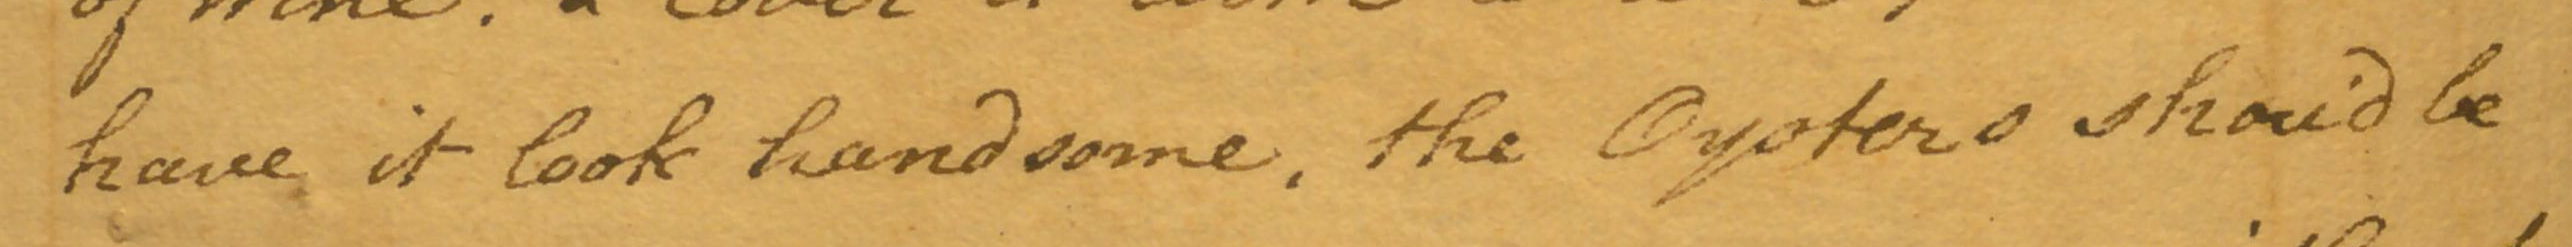have it look handsome, the Oysters shou'd be
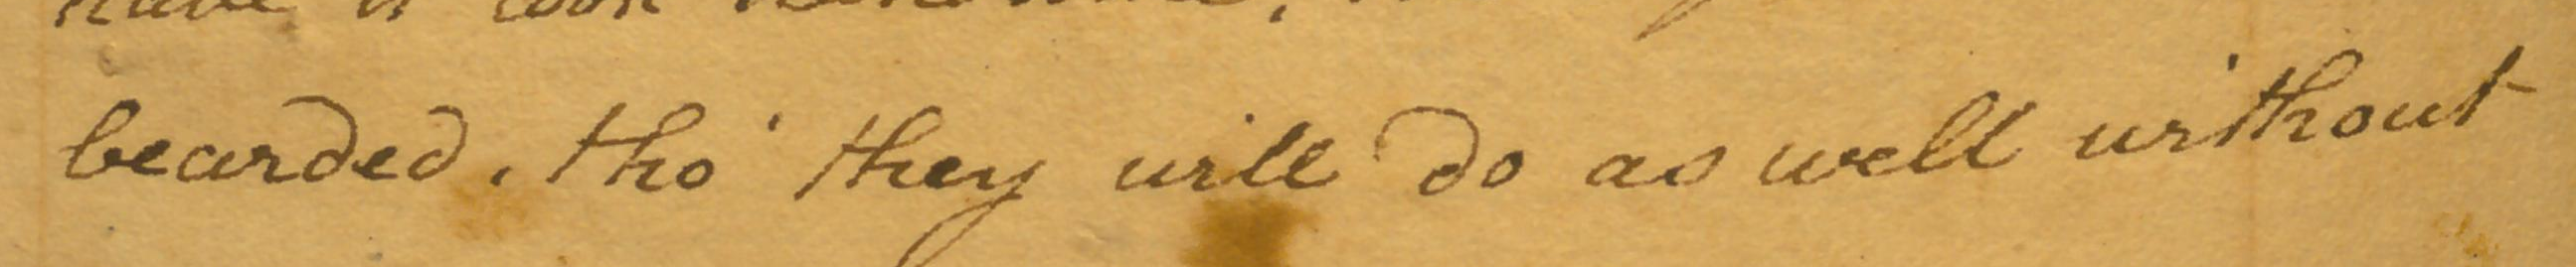bearded, tho' they will do as well without
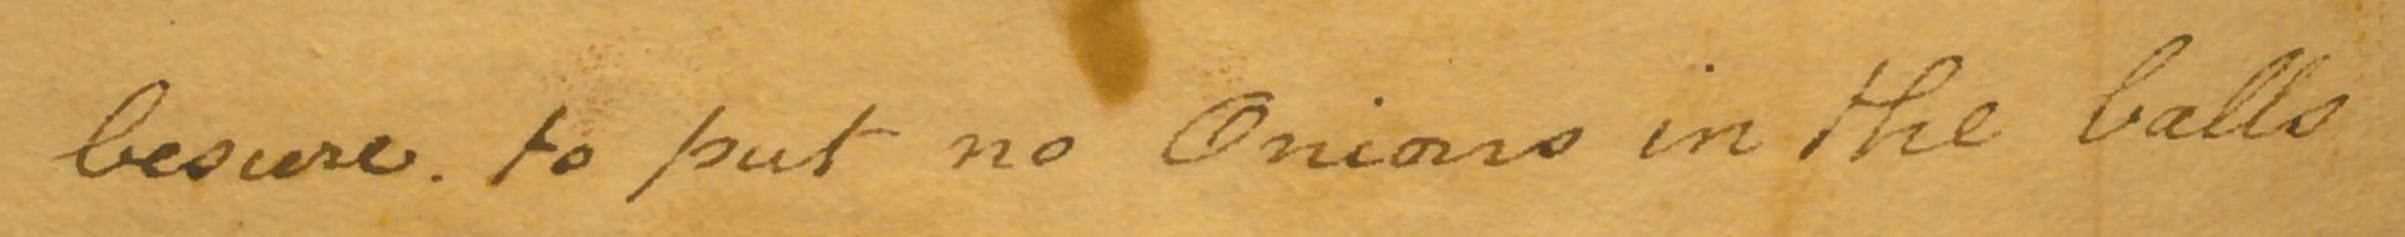besure. to put no Onions in the balls
